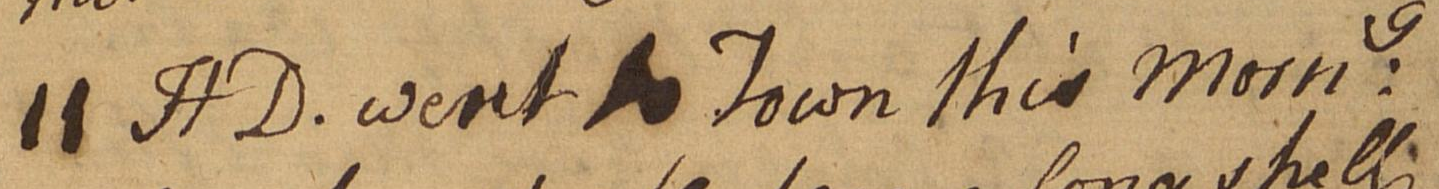11 H D. went to Town this morn^g:
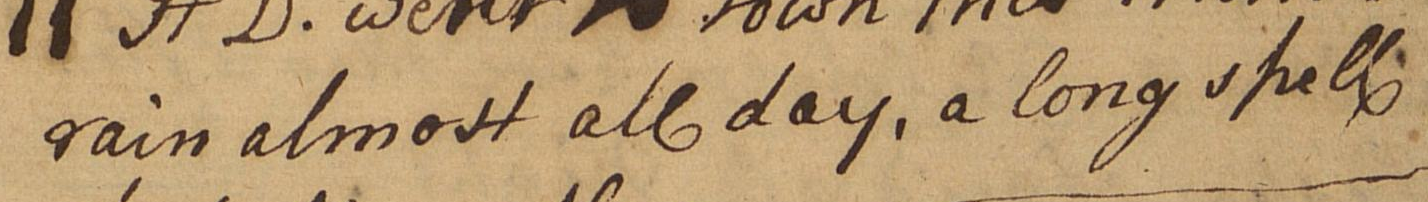rain almost all day, a long spell
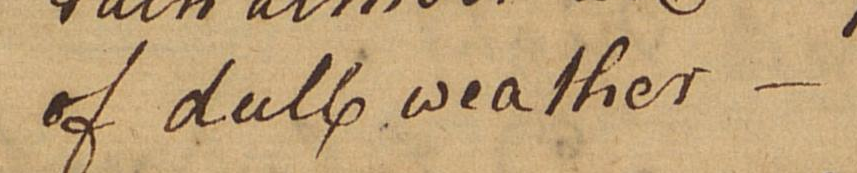of dull weather-
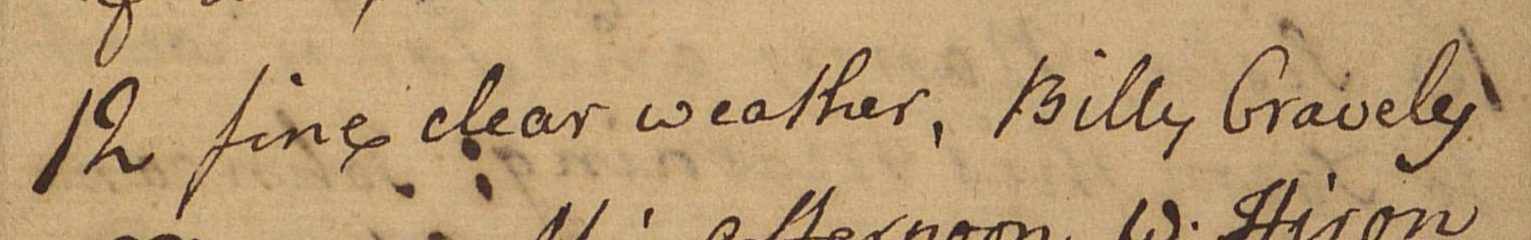12 fine clear weather, Billy Gravely
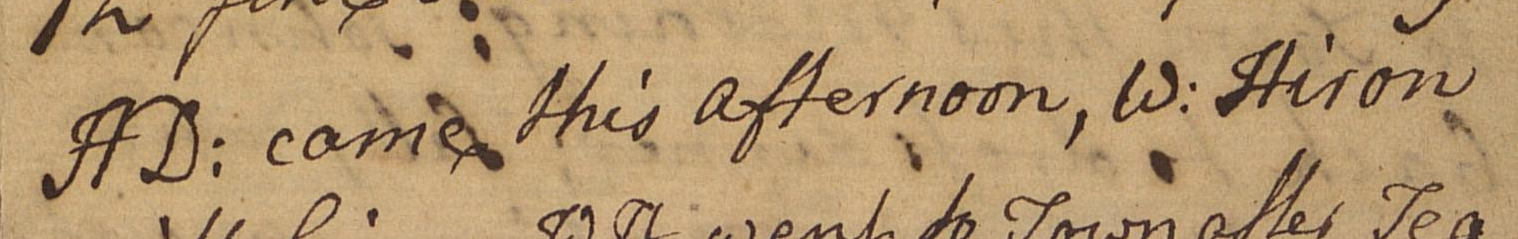HD: came this afternoon, W: Hiron
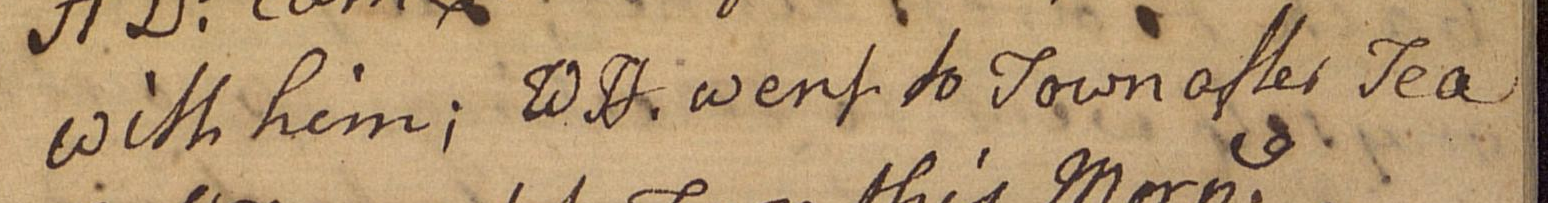with him; WH. went to Town after Tea
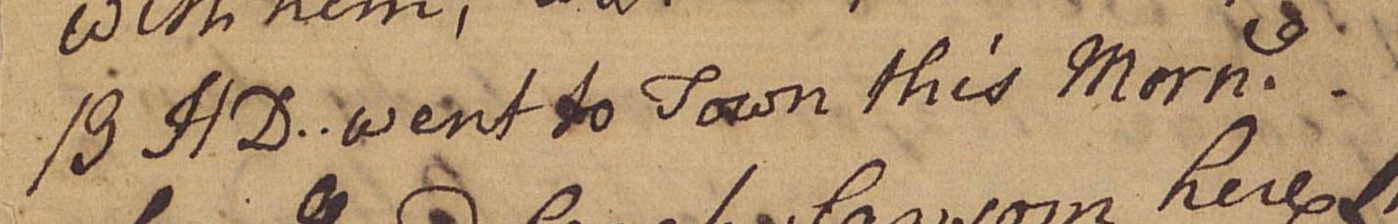13 H D. went to Town this Morn^g .
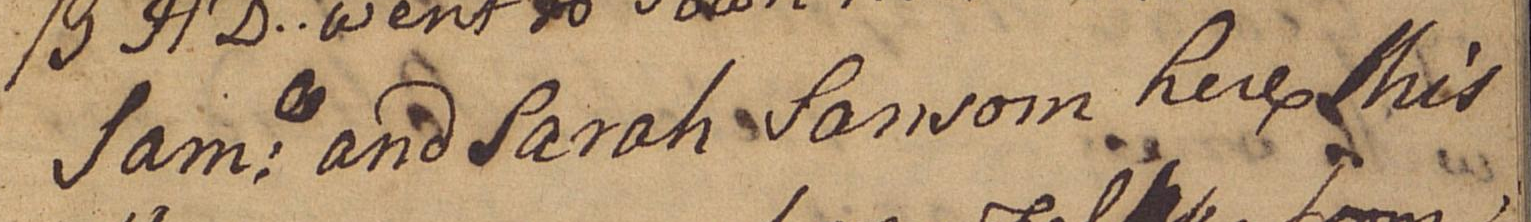Sam^l; and Sarah Sansom here this
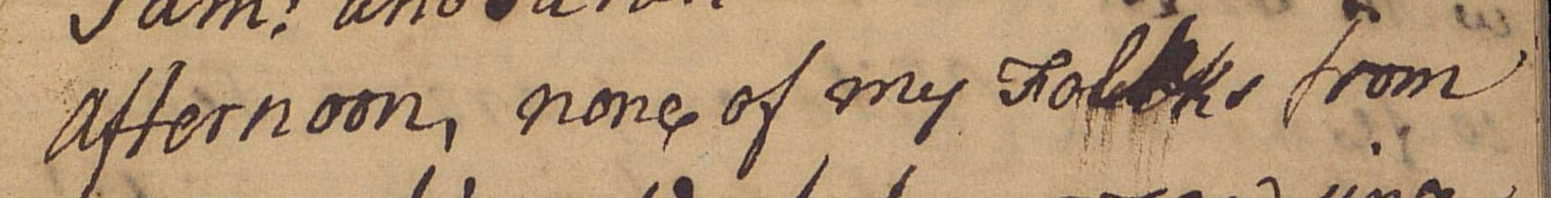afternoon, none of my Fol[_]ks from
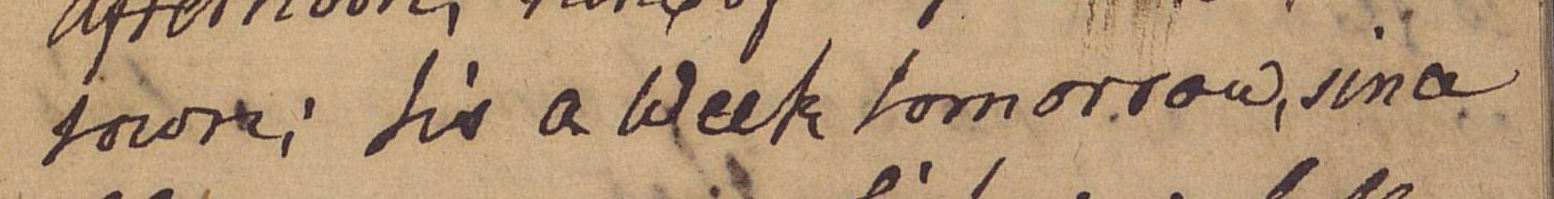town; tis a Week tomorrow, since
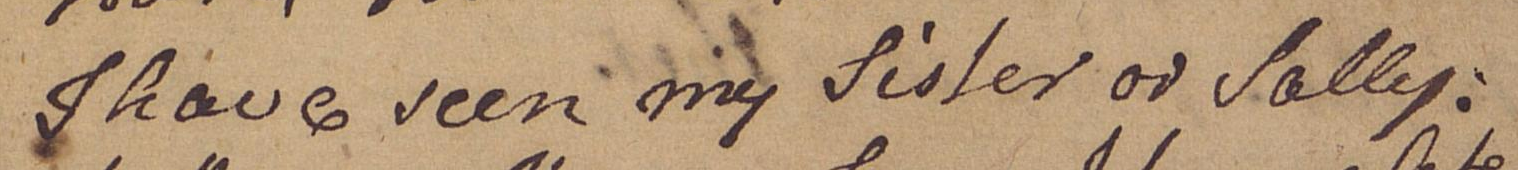I have seen my Sister or Sally.
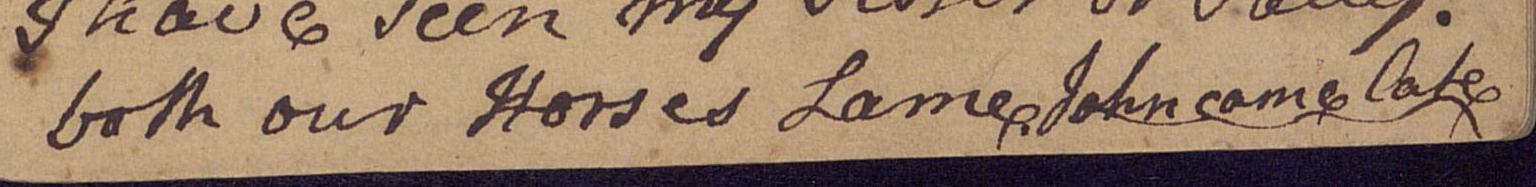both our Horses Lame. John came late
